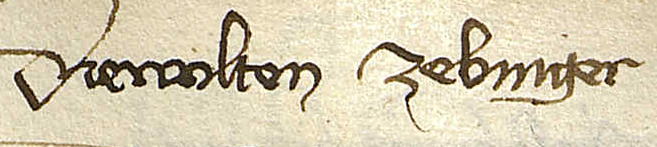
Diewalten ʒebinger
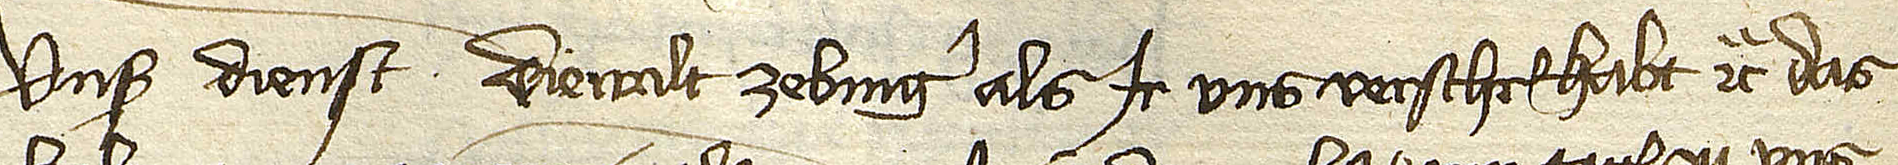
Vnſ* dienſt . Diewalt ʒebing* als Ir vns verſchr* habt ec* das
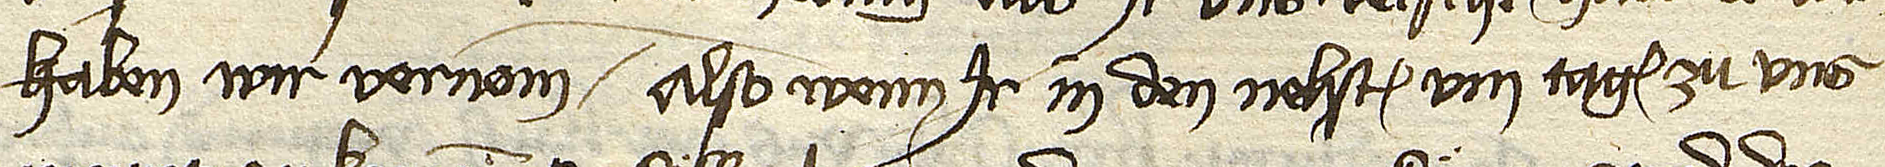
haben wir vernom* / Alſo wenn Ir in den nehſt* viii tag* ʒu vns
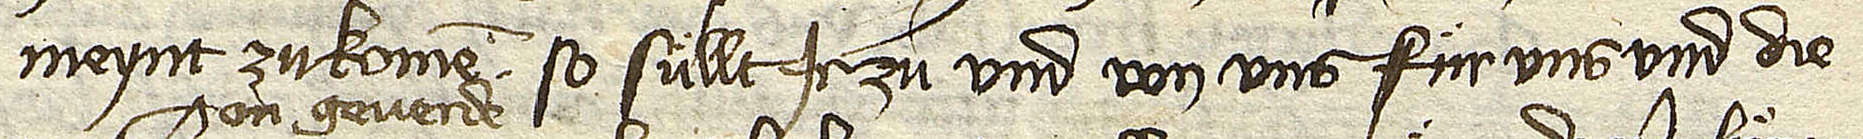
meynt ʒu kome* . ſo ſüllt Ir ʒu vnd von vns für vns vnd die
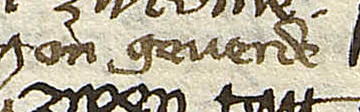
on geuerde
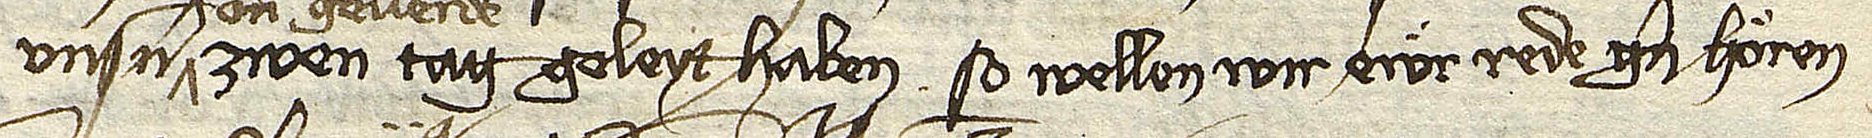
vnſ*n ʒwen tag geleyt haben . ſo wellen wir ewr rede g*n hören
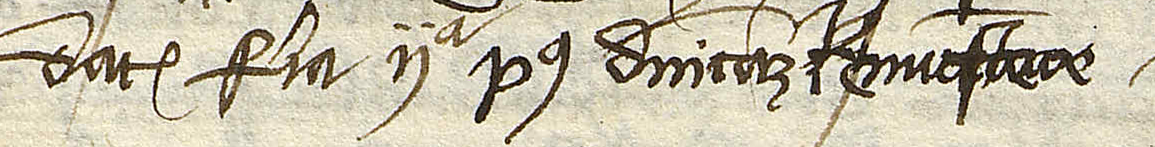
Dat* fia* ii* p* dnica* Remiſcere* /
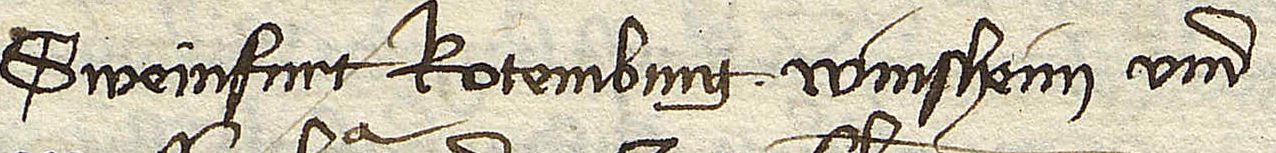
Sweinfurt Rotemburg . winſheim vnd
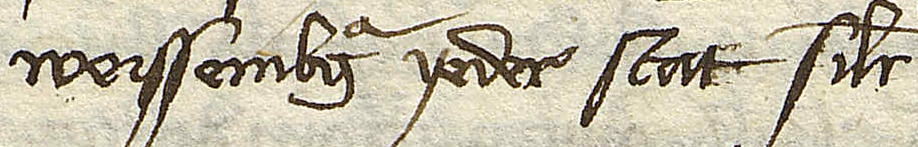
weiſſemb*g yeder ſtat ſilr*
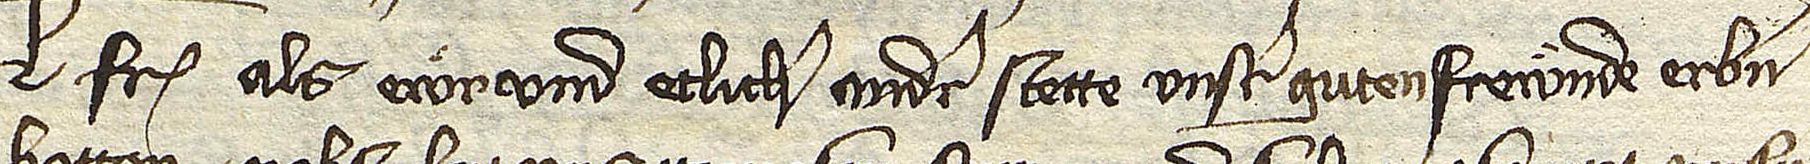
L* fr* als ewr vnd etlich* and*r ſtette vnſ*r guten frewnde erb*n
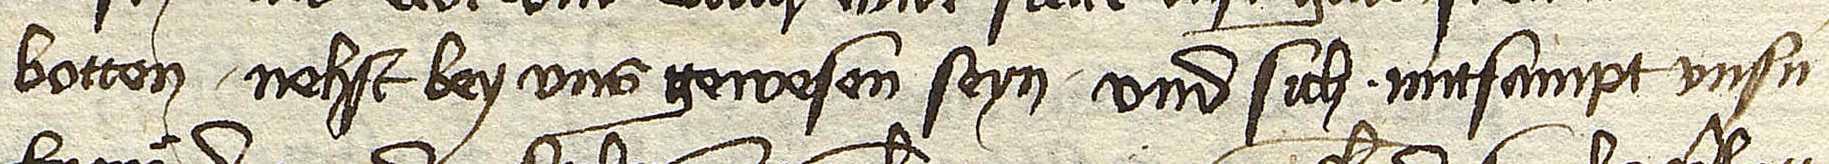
botten / nehſt bey vns geweſen ſeyn / vnd ſich . mitſampt vnſ*n
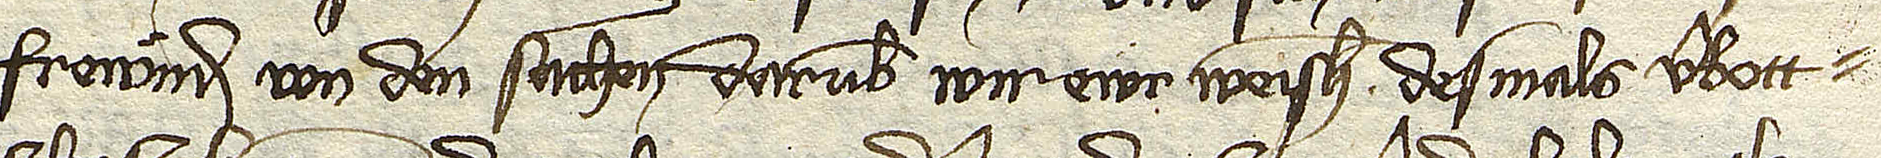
frewnd* von den ſachen daru*b wir ewr weiſh* . deſmals v*bott =
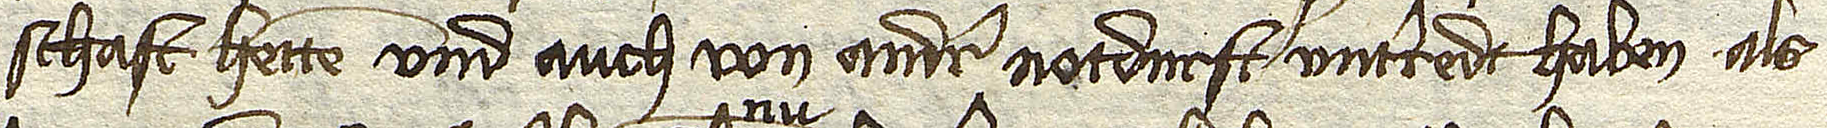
ſchaft hette* vnd auch von and*r notdurft vnt*redt haben . als
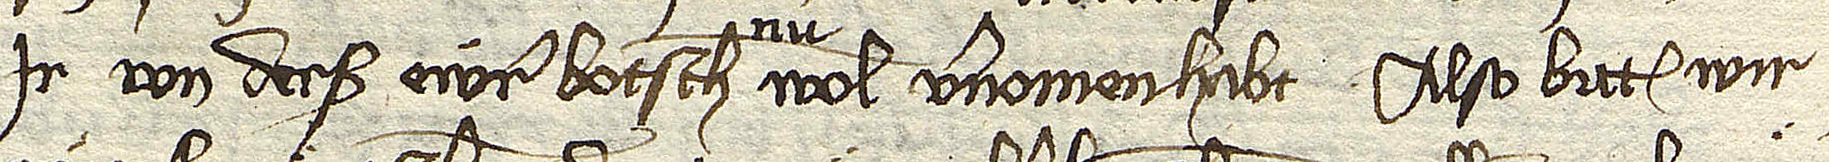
Ir von derſ* ew*r botſch* wol v*nomen habt . Alſo bitt* wir
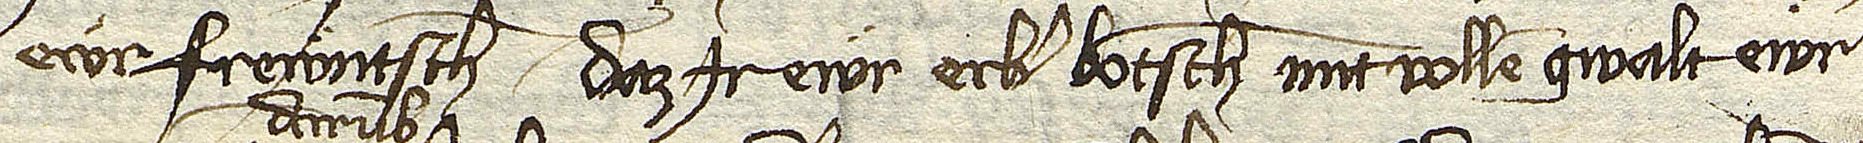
ewr frewntſch* / daʒ Ir ewr erb* botſch* mit volle* gwalt ew*r
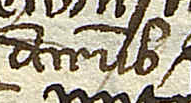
daru*b
